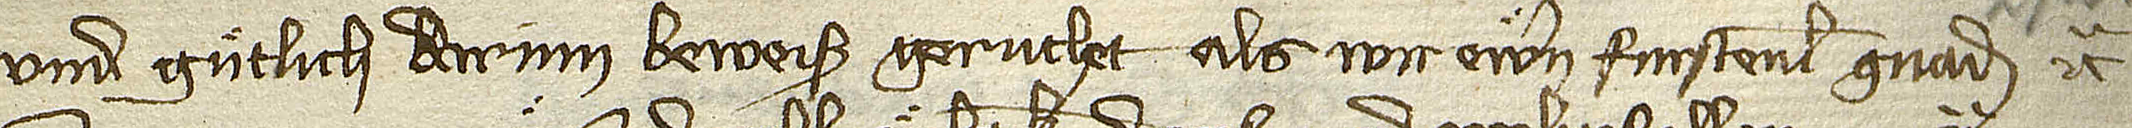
vnd gütlich darinn beweiſ* geruchet als wir eẅ*n furſtenl* gnad* ec*
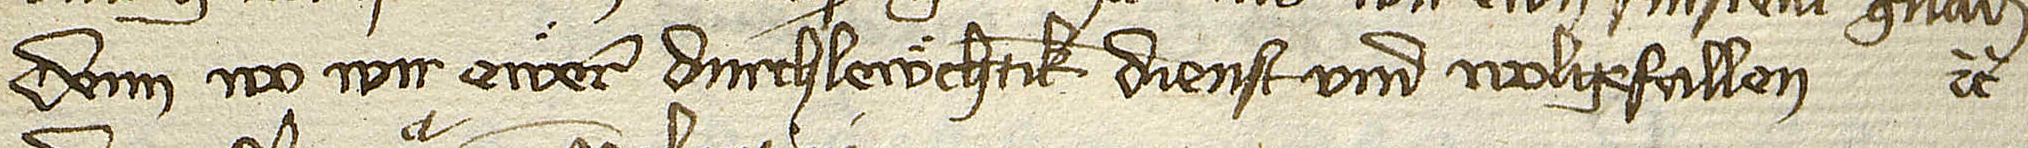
Denn wo wir eẅer* durchleẅchtik* dienſt vnd wolgefallen ec*
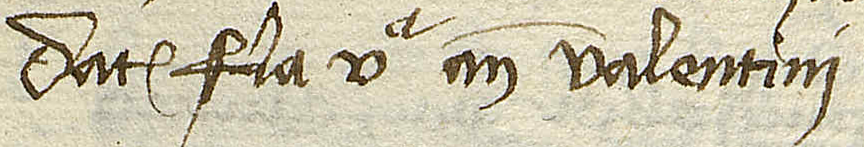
Dat* f*ia v* an* valentini
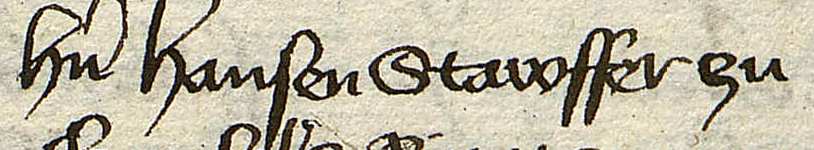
hn* hanſen Stawffer cʒu
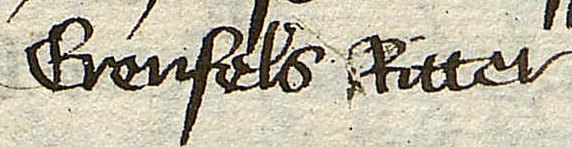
Erenfels Ritter
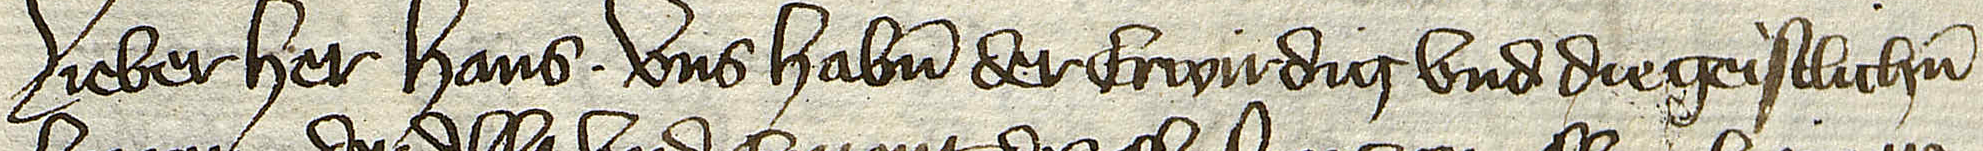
Lieber her Hans . Vns hab*n der Erwirdig vnd die geiſtlich*n
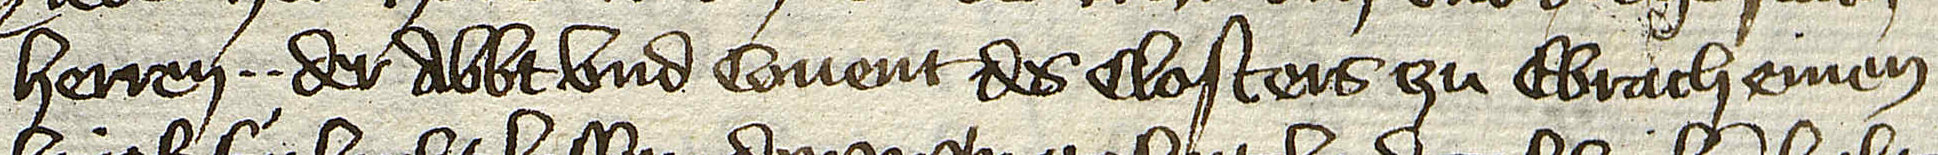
herren ~ der Abbt vnd Couent des Cloſters cʒu Ebrach einen
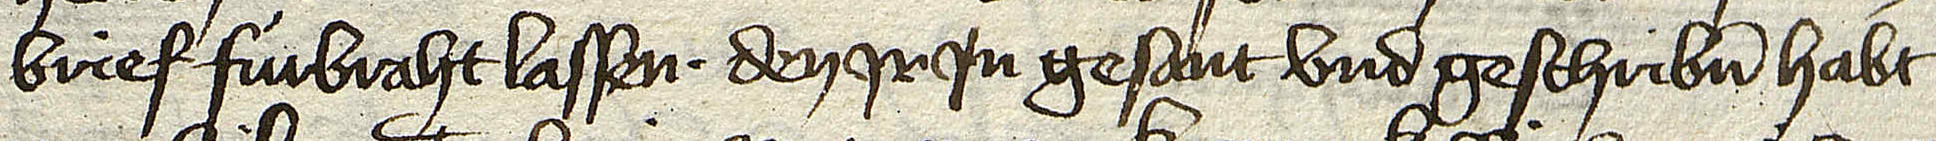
brief fürbraht laſſen . den Ir In geſant vnd geſchrib*n habt
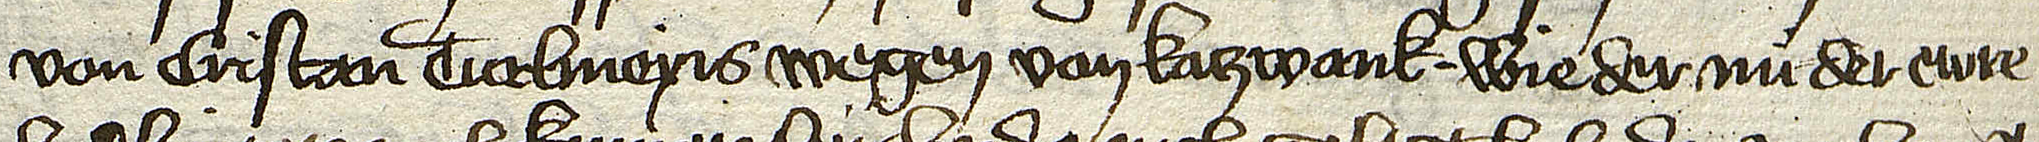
von Criſtan Turlmeyrs wegen von kacʒwank . Wieder nü der ewre
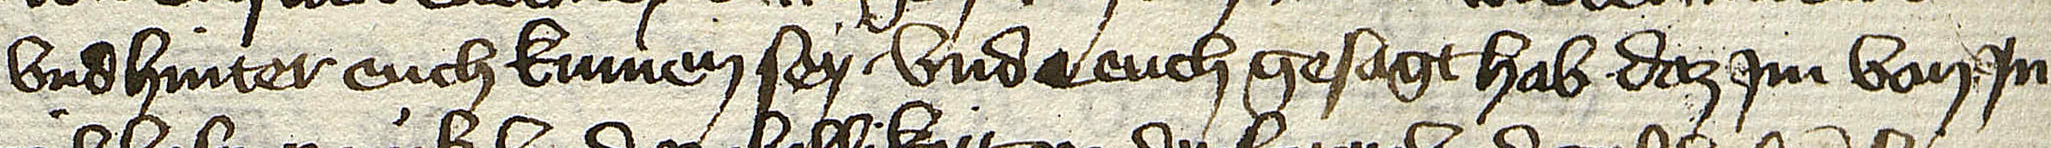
vnd hinter euch kumen ſey / vnd e euch geſagt hab . daʒ Im von . In
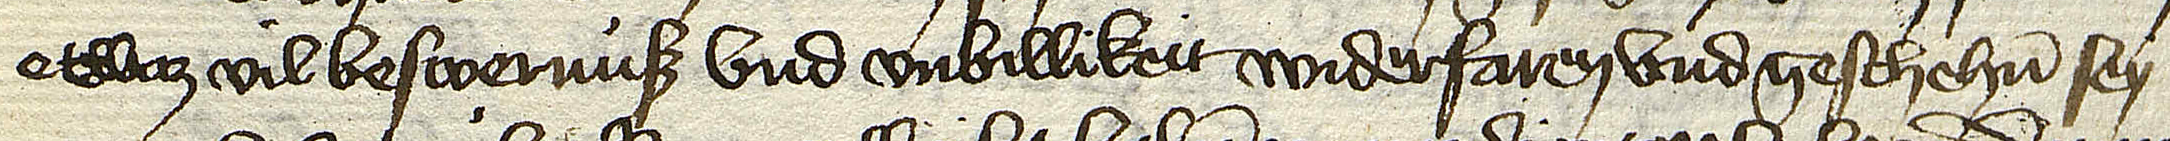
etwaʒ vil beſwernüſ* vnd vnbillikeit widerfaren vnd geſchehn ſey
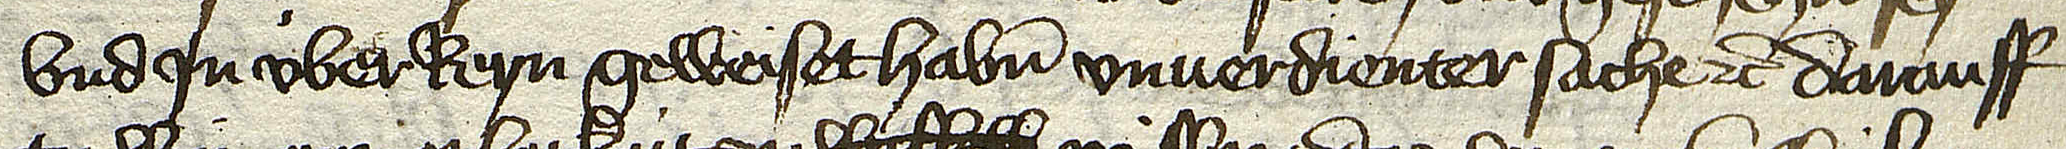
vnd In v̈ber Reyn geweiſet hab*n vnuerdienter ſache ec* darauff
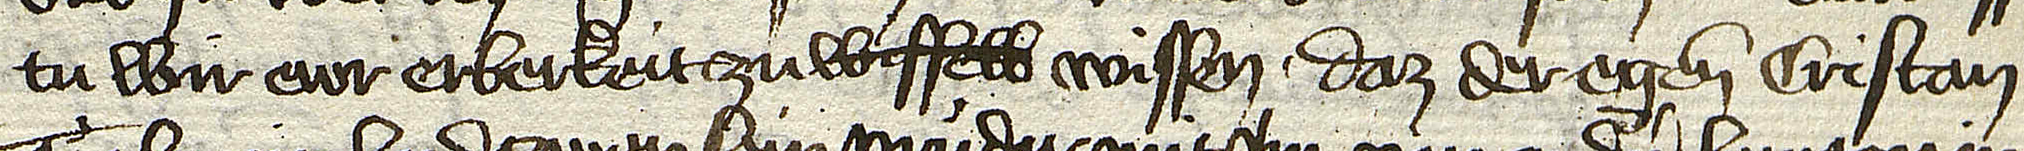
tu wir ewr erberkeit ʒu wiſſew wiſſen . daʒ der egen* Criſtan
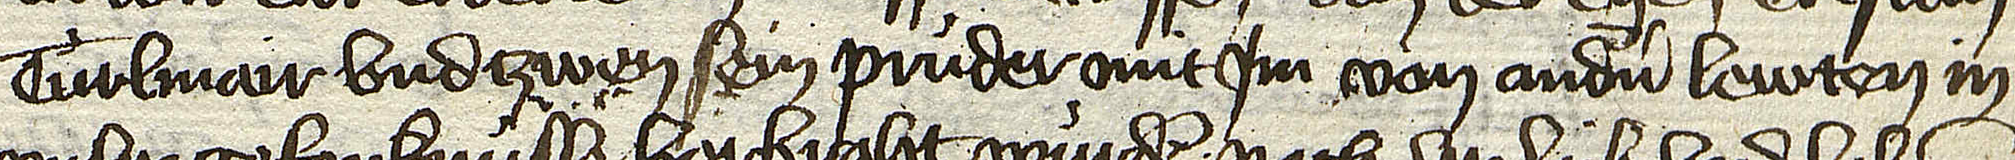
Türlmair vnd cʒwen ſein prüder mit Im von and*n lewten in
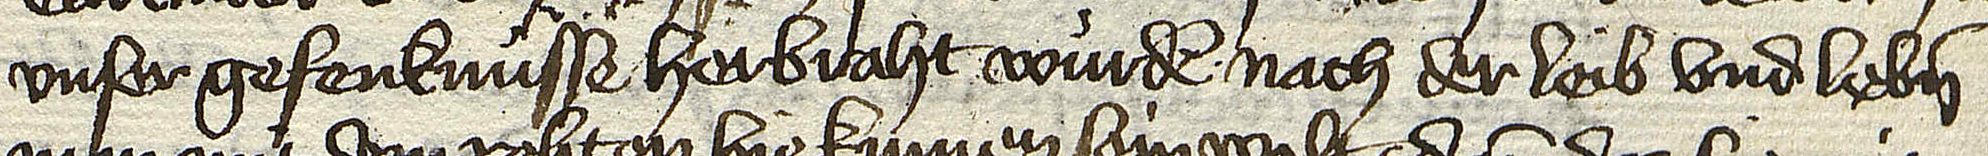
vnſer gefenknüſſe herbraht würd* . nach der leib vnd lebn*
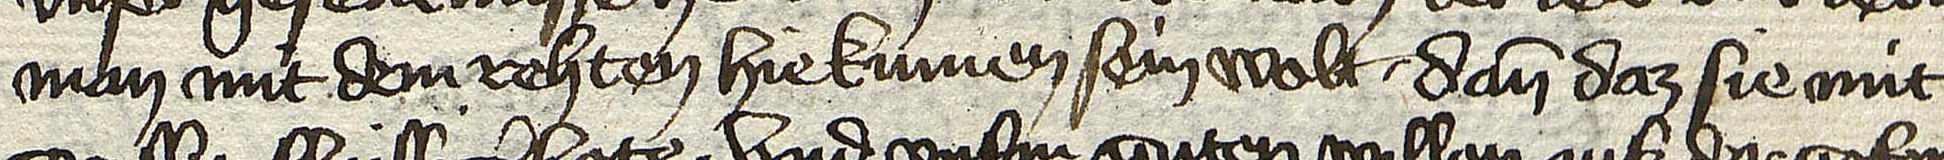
man mit dem rechten hie kumen ſein wolt . dan* daʒ ſie mit
